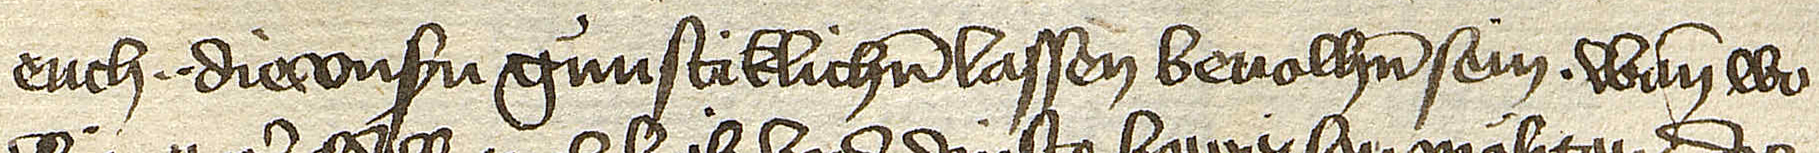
euch ~ die vnſ*n günſtiklichn* laſſen beuolhn* ſein . wan* wo
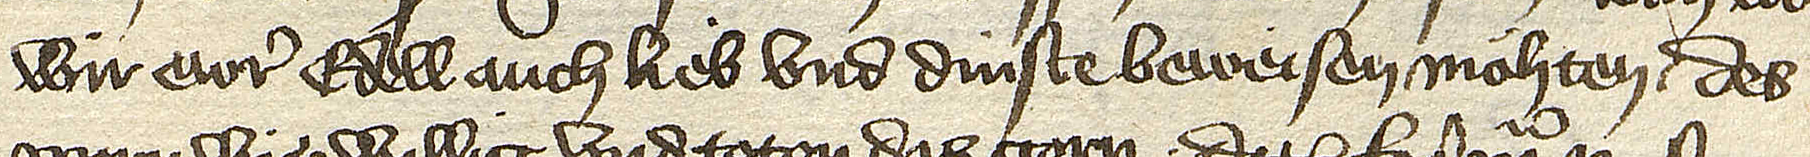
wir ewr* Edell auch lieb vnd dinſte beweiſen möhten / des
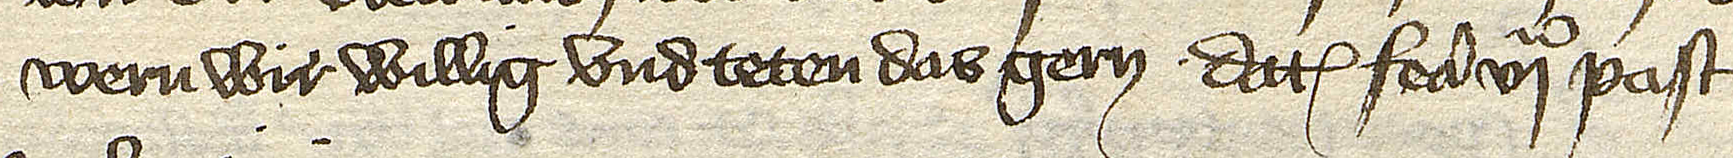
wern wir willig Vnd teten das gern dat* fea* vi* poſt
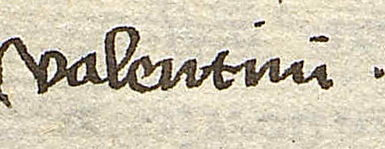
valentini .
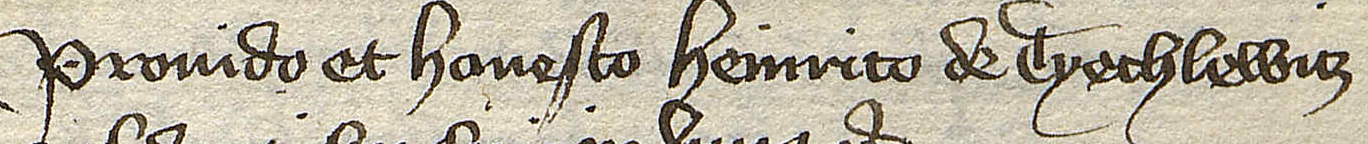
Prouido et honeſto Heinrico de Tyechlewicʒ
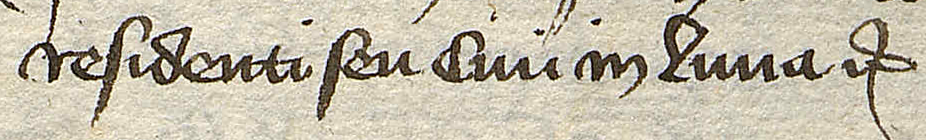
reſidenti ſeu Ciui in Luna §
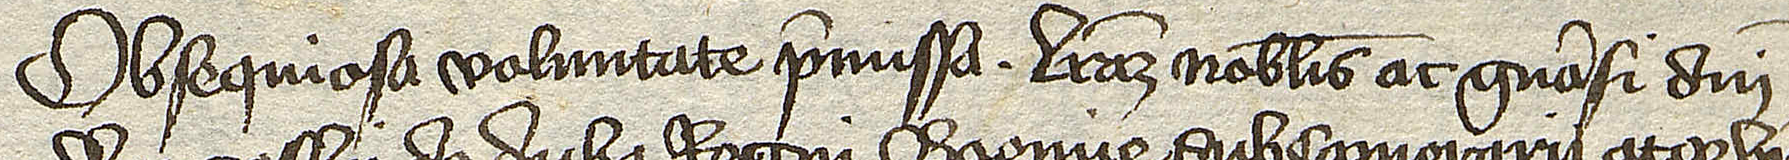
Obſequioſa voluntate p*miſſa . L*ra* nob*lis ac g*n*oſi d*ni
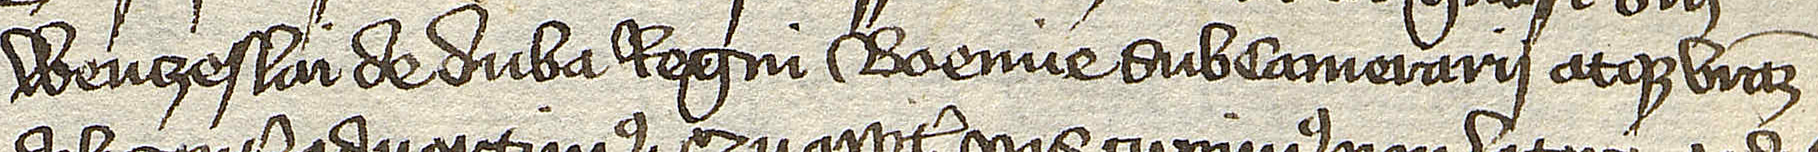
Wencʒeſlai de Duba Regni Boemie Sub Camerarii atq* v*ra*
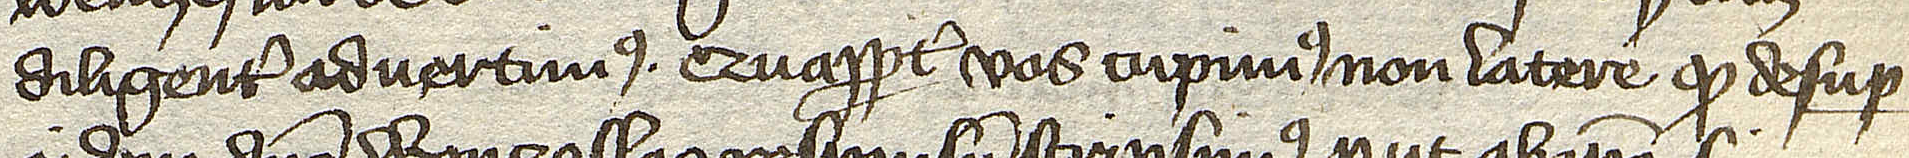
diligent* aduertim* . Quap*pt* vos cupim* non latere q* deſup*
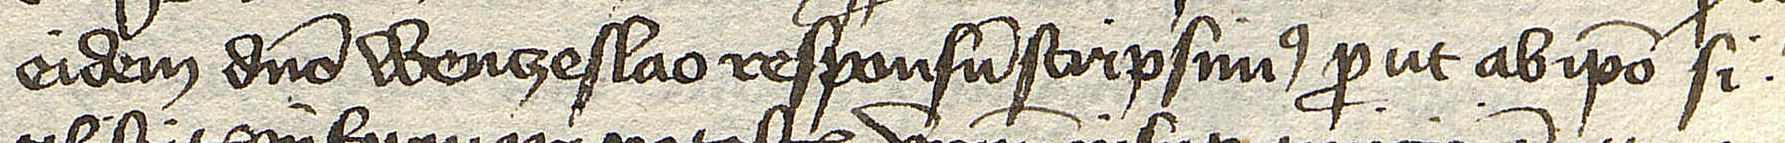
eidem d*no Wencʒeſlao reſponſu* ſcripſim* p*ut ab ip*o ſi
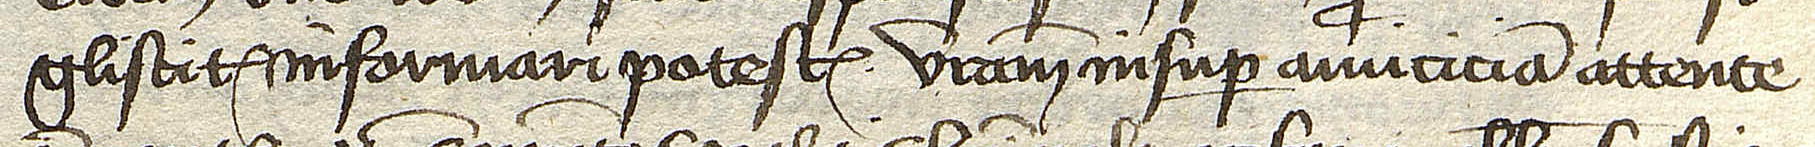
gliſcit* informaro poteſt* v*ram inſup* amicicia* attente
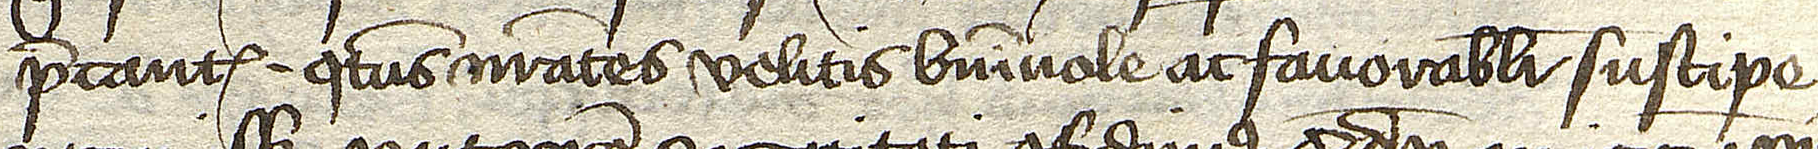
p*cant* . q*t*us iurat*es velitis b*niuole ac fauorab*l*r ſuſcip*e
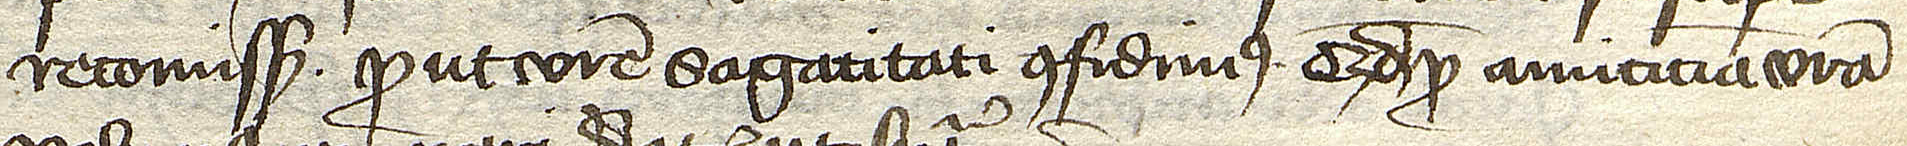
recomiſſ* . p*ut v*re Sagacitati *fidimu* . Q*d p* amicicia v*ra
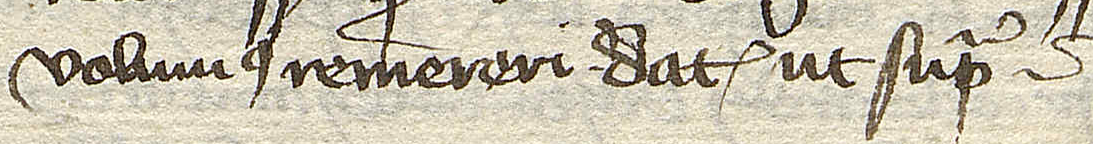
volum* remereri . Dat* ut sup*ec*
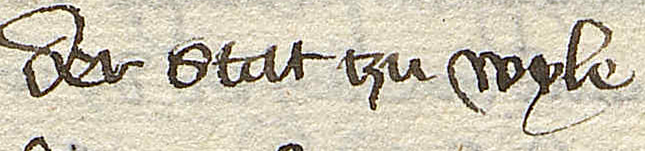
Der Stat cʒu wyle
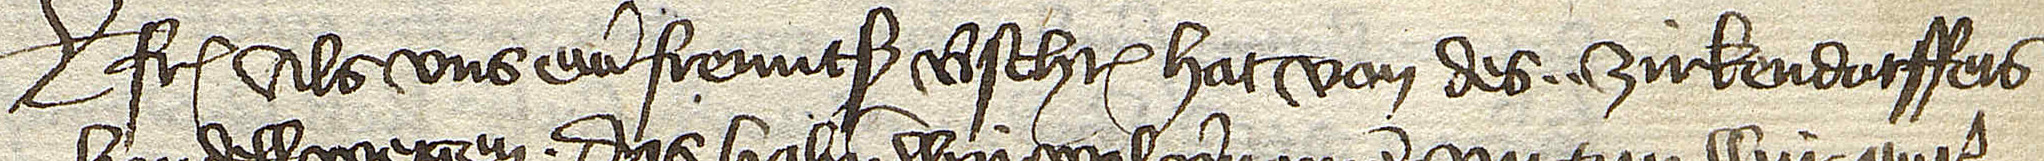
L* fr* Als vns ew* freuntſ* v*ſchr* hat von des ~ cʒirkendorffers
